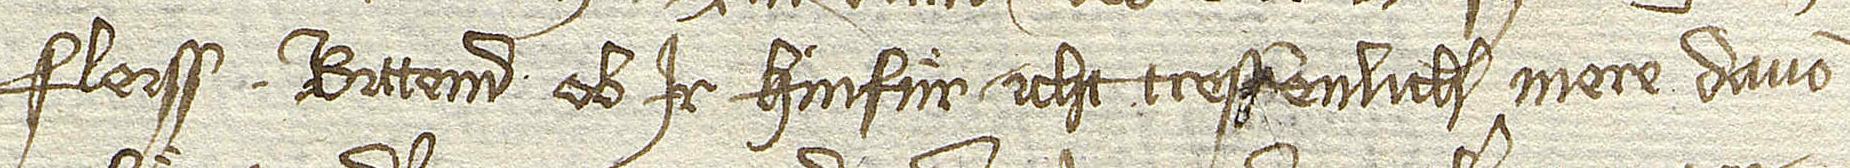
fleiſſ . Bittend ob Ir hinfür icht treffenlich* mere dauo*
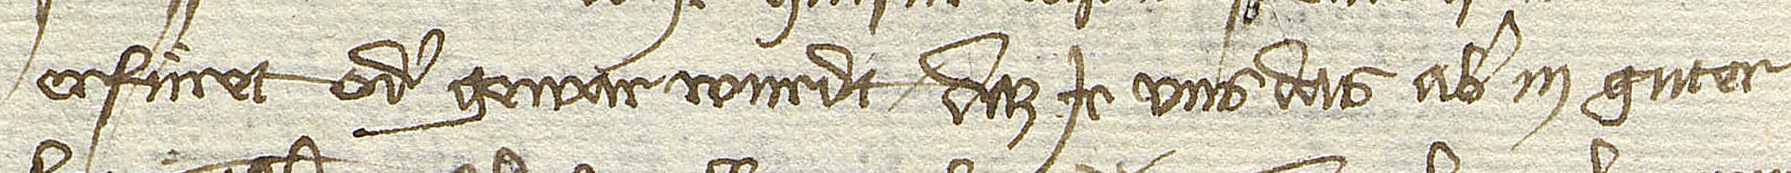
erfüret od* gewar wurdt / daʒ Ir vns das ab* in guter
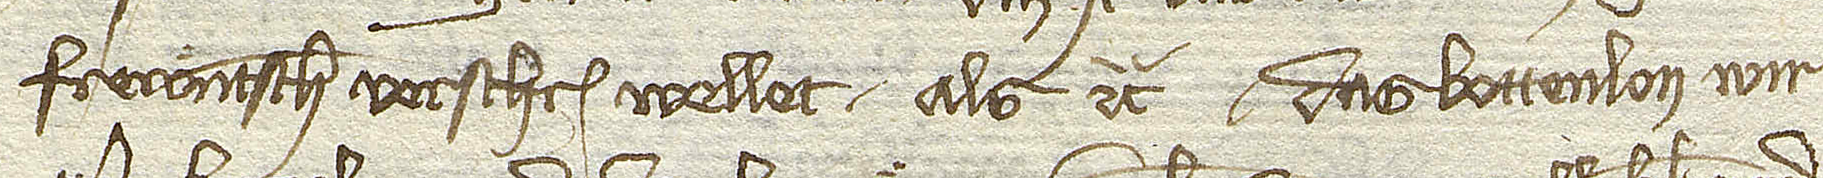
frewntſch* verſchr* wellet / als ec* / Das bottenlon wir
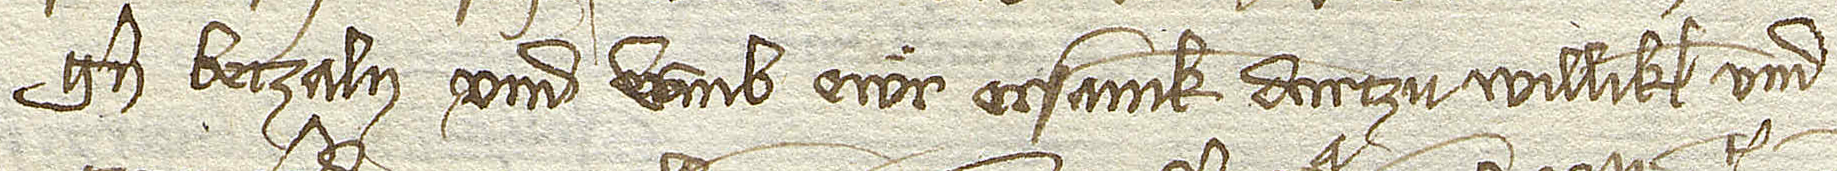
g*n becʒaln vnd Vmb ewr erſamk* darcʒu willikl* vnd
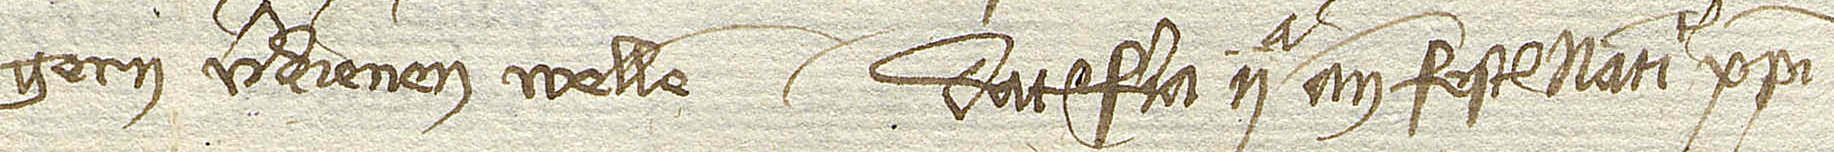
gern v*dienen welle* / Dat fia* ii* an feſt* Nati* xpi*
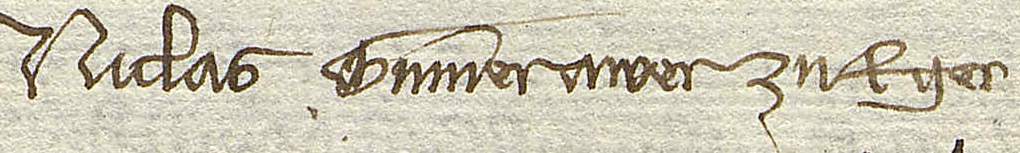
Niclas Gum*erawer ʒu Eger
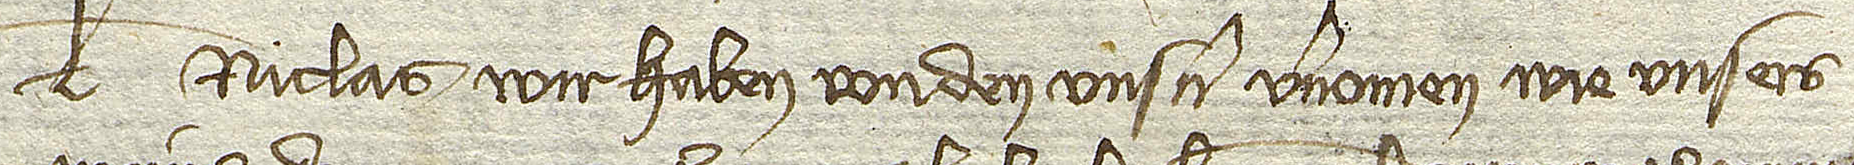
L* Niclas wir haben von den vnſ*n v*nomen wie vnſers
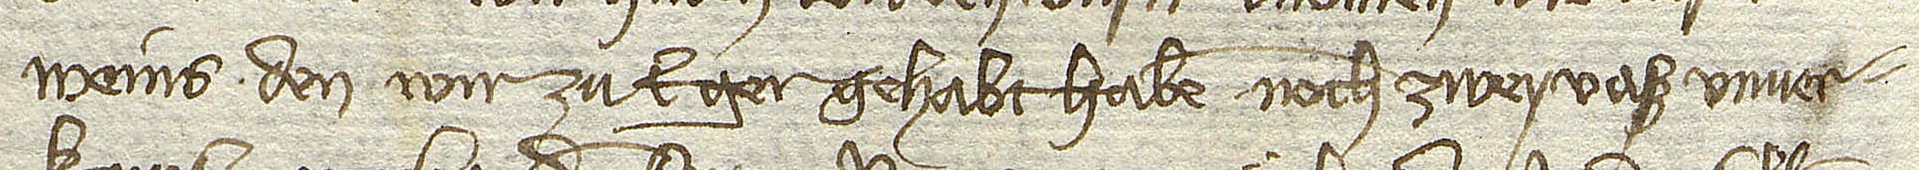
weins . den wir ʒu Eger gehabt habe* noch ʒwey vaſʒ vnuer =
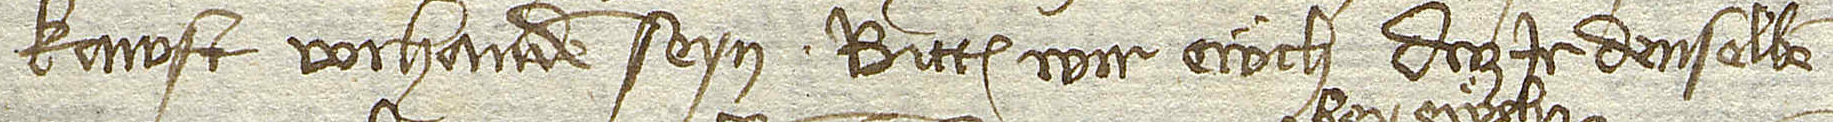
kawft vorhande* ſeyn . Bitt* wir ewch daʒ Ir denſelbe*
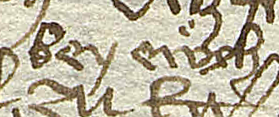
bey ewch
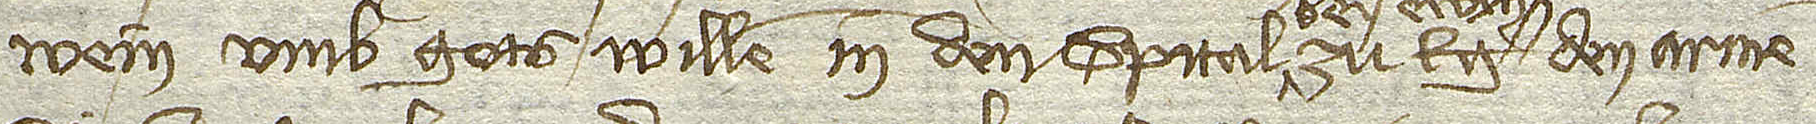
wein vmb gots wille* in den Spital ʒu Eg* den arme*
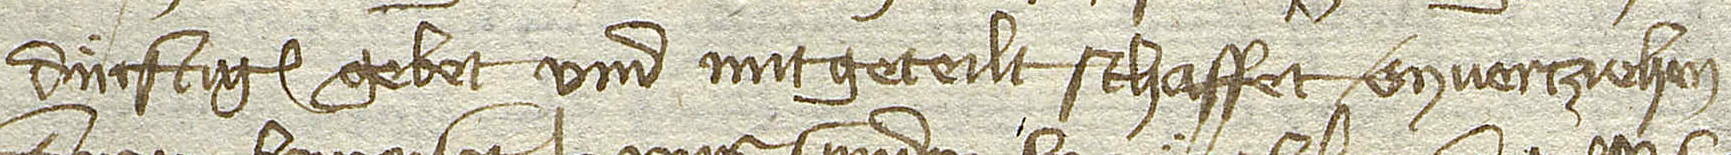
dürftig* gebet vnd mit geteilt ſchaffet / on uercʒiehen
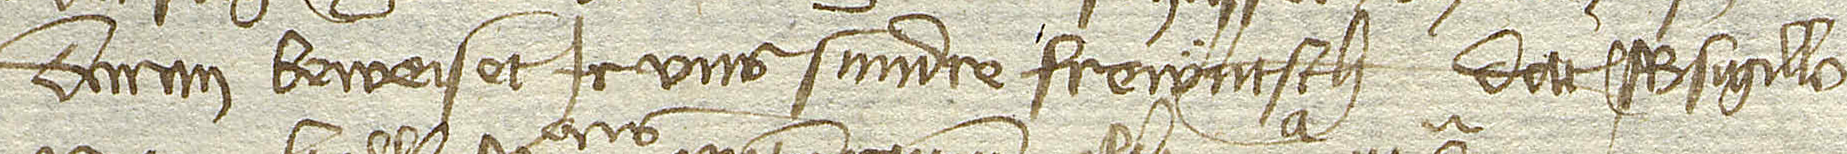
Daran beweiſet Ir vns ſundre frewntſch* Dat* ſ*B ſigillo
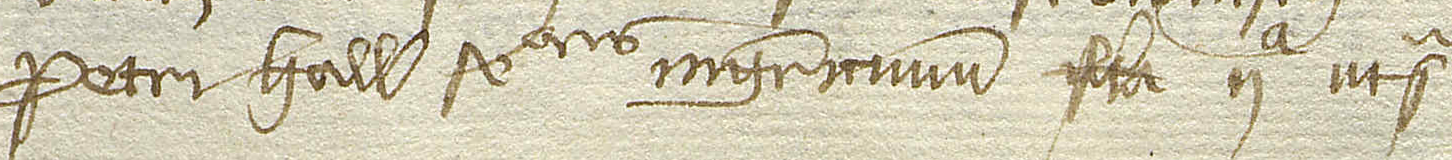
Petri Hall* ſe* m*g*r ciuiu* fia* ii* ut ſ*
